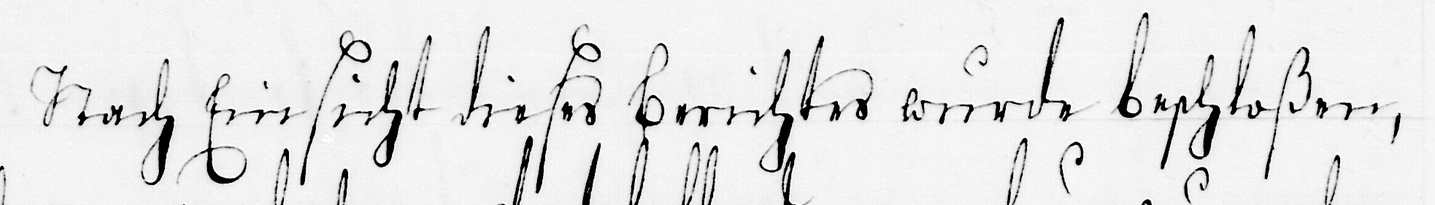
Nach Einsicht dieses Berichtes wurde beschloßen,
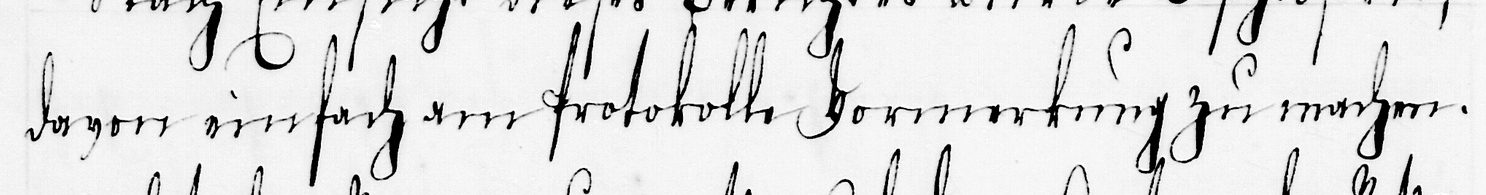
davon einfach am Protokolle Vormerkung zu machen.
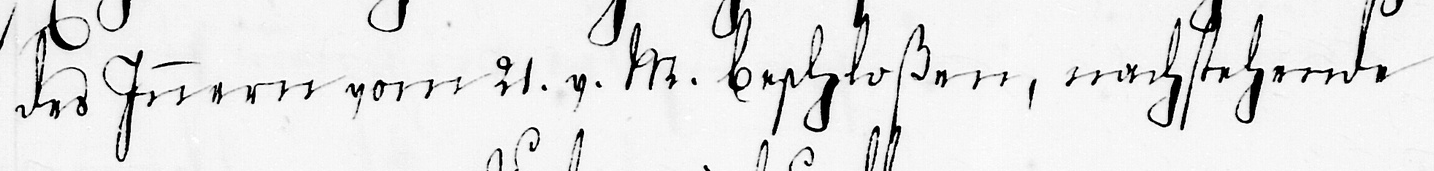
des Innern vom 21. v. M. beschloßen, nachstehende
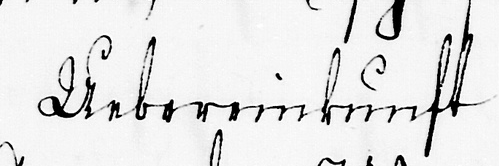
Uebereinkunft
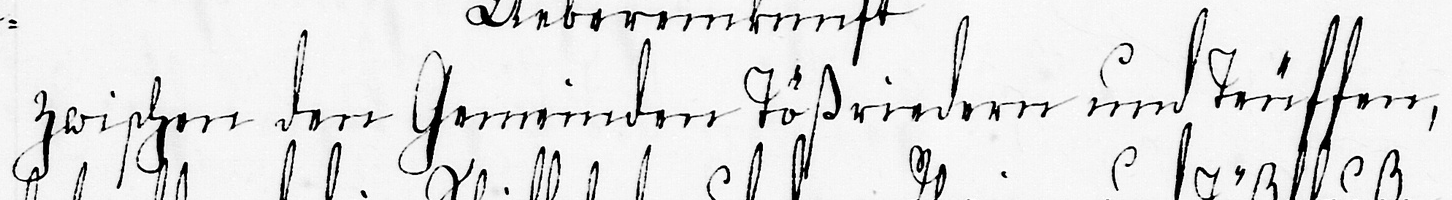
zwischen den Gemeinden Tößriedern und Teuffen,
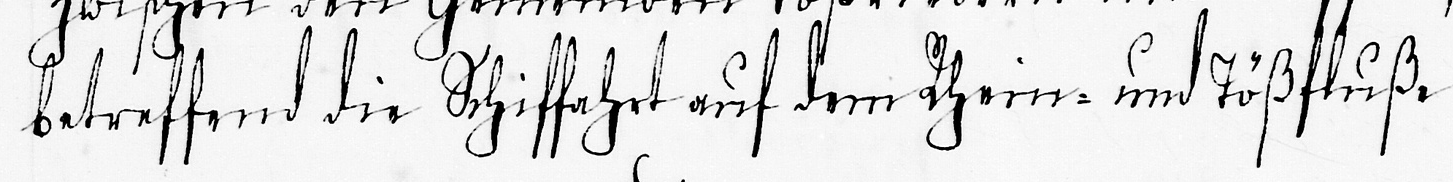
betreffend die Schiffahrt auf dem Rhein- und Tößfluße
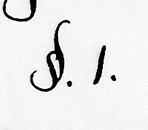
§. 1.
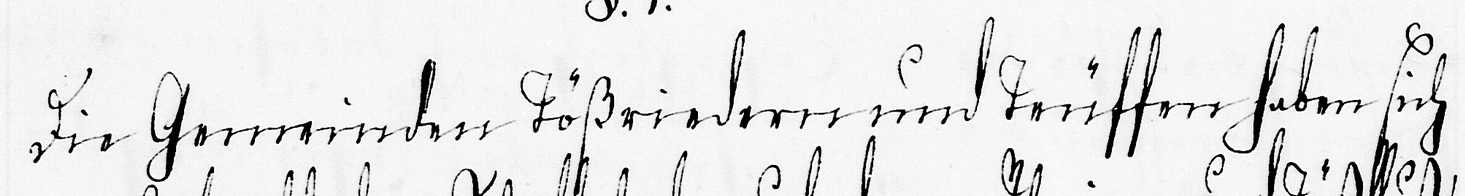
Die Gemeinden Tößriedern und Teuffen haben sich
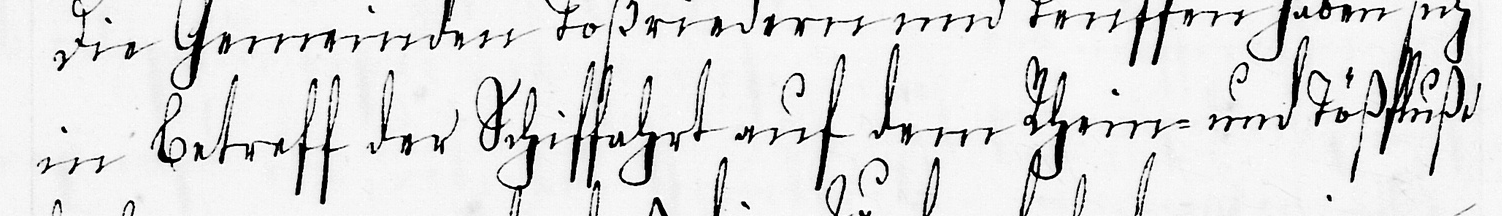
in Betreff der Schiffahrt auf dem Rhein- und Tößfluße
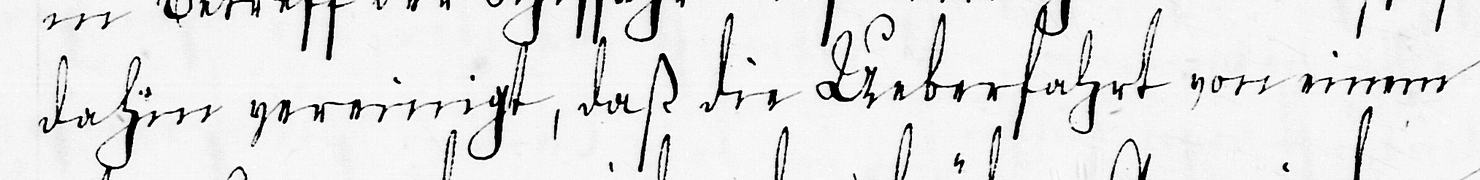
dahin vereinigt, daß die Ueberfahrt von einem
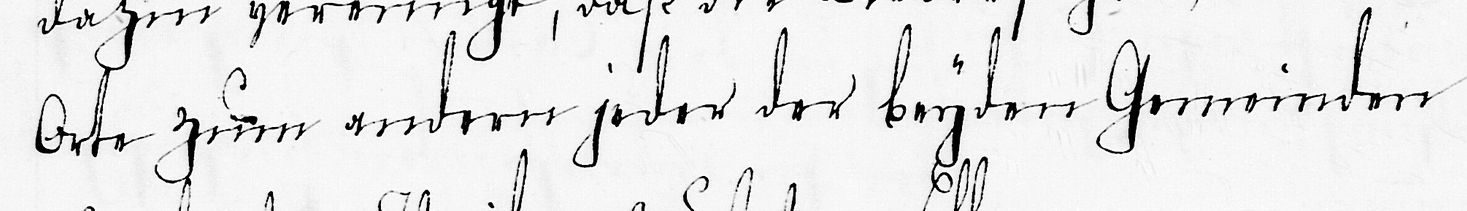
Orte zum andern jeder der beyden Gemeinden
